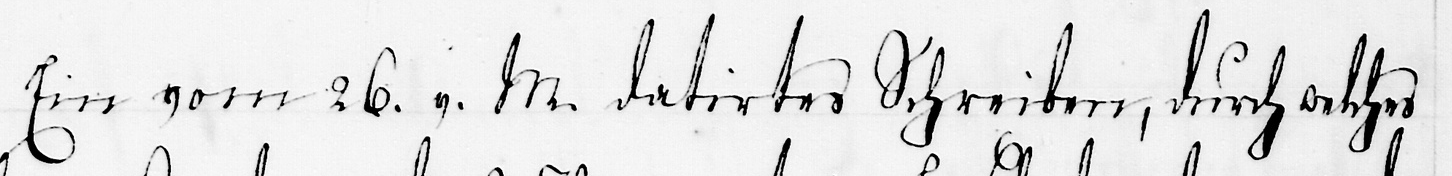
Ein vom 26. v. M. datirtes Schreiben, durch welches
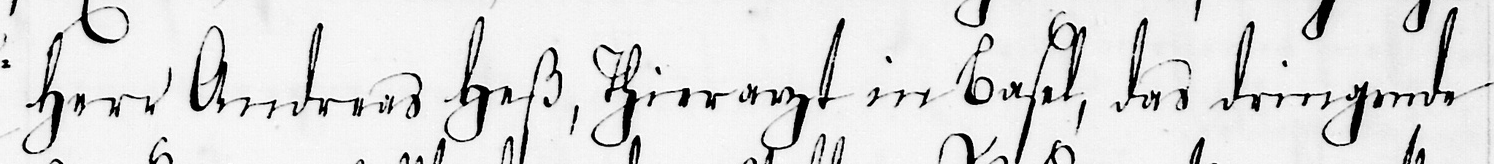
Herr Andreas Heß, Thierarzt in Basel, das dringende
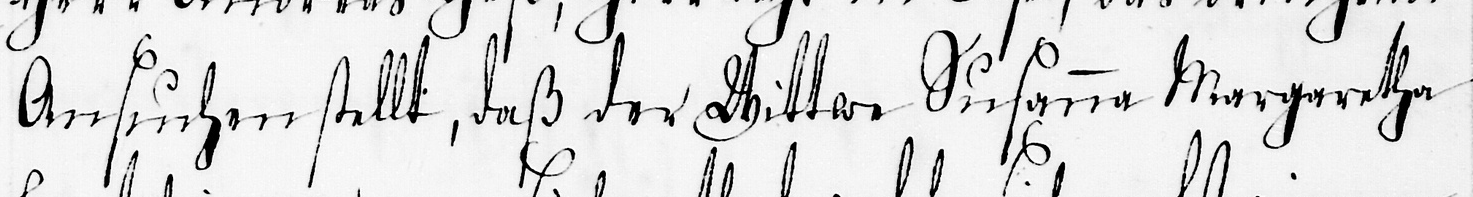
Ansuchen stellt, daß der Wittwe Susanna Margaretha
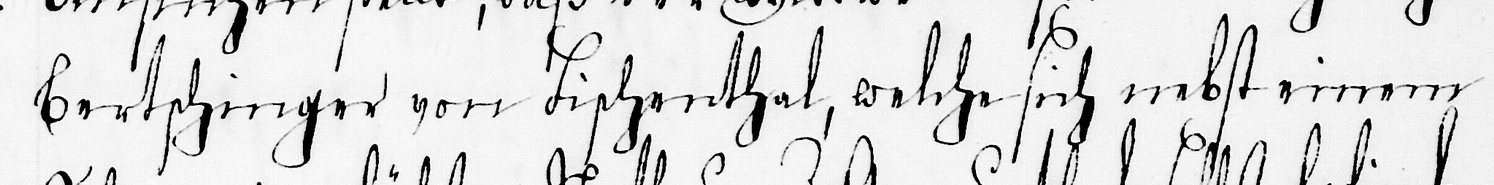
Bertschinger von Fischenthal, welche sich nebst einem
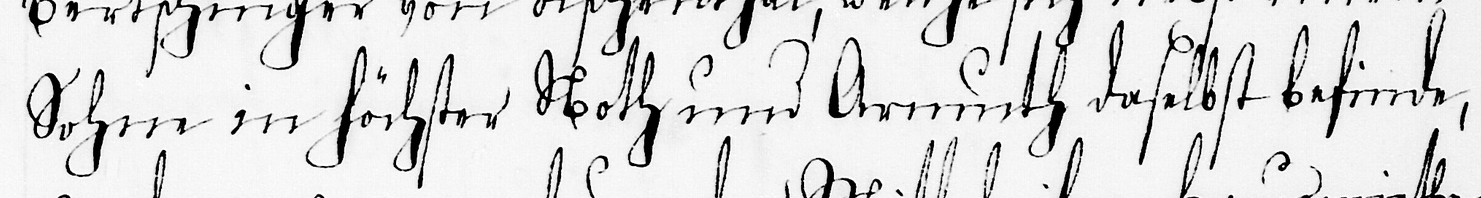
Sohne in höchster Noth und Armuth daselbst befinde,
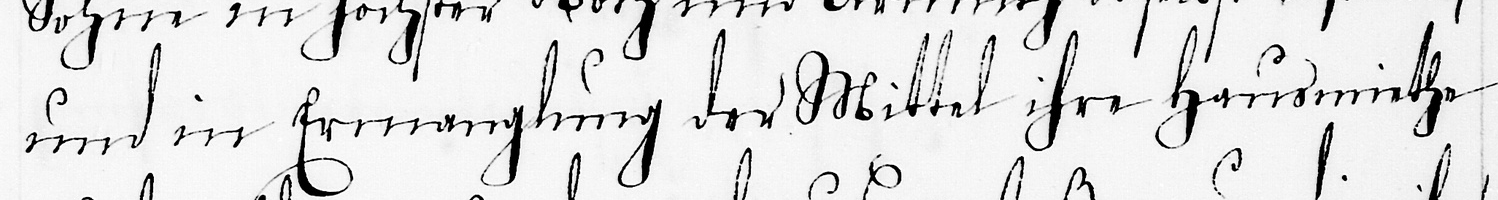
und in Ermanglung der Mittel ihre Hausmiethe
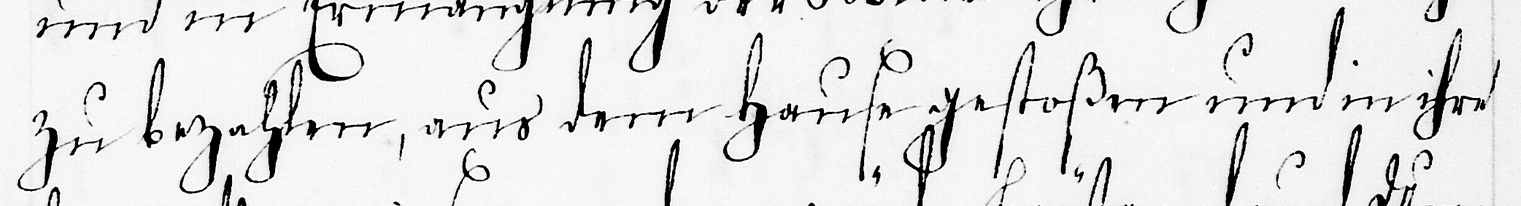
zu bezahlen, aus dem Hause gestoßen und in ihre
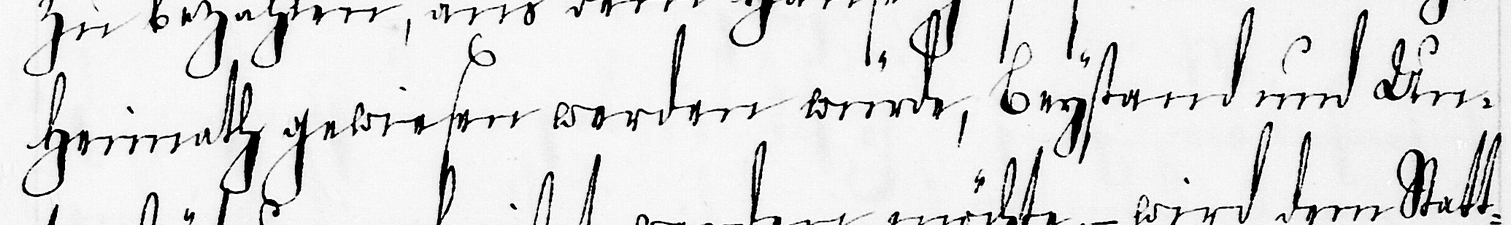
Heimath gewiesen werden würde, Beystand und Un¬
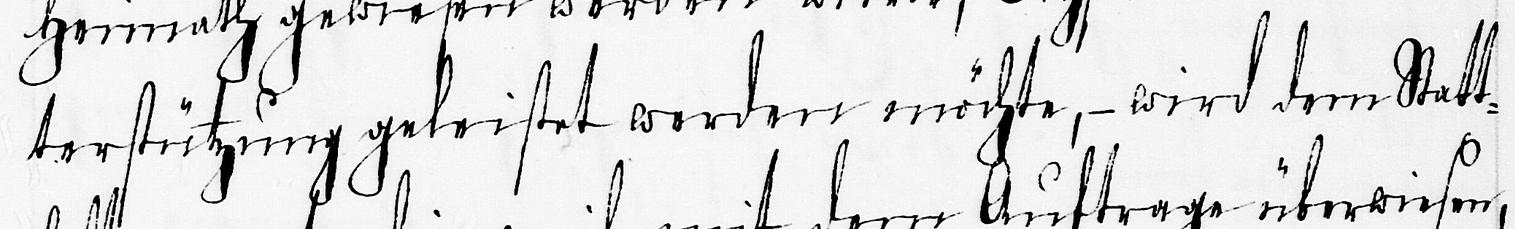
terstützung geleistet werden möchte, – wird dem Statt¬
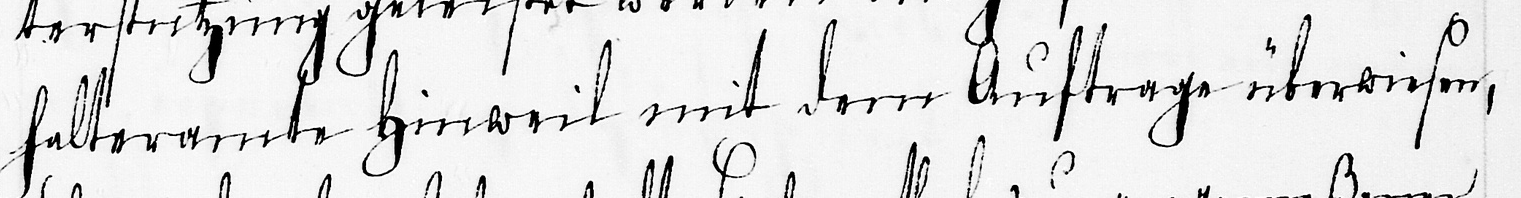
halteramte Hinweil mit dem Auftrage überwiesen,
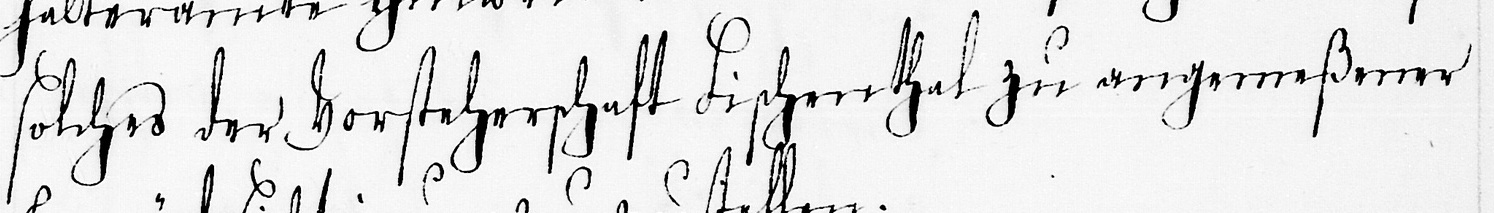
solches der Vorsteherschaft Fischenthal zu angemeßener
